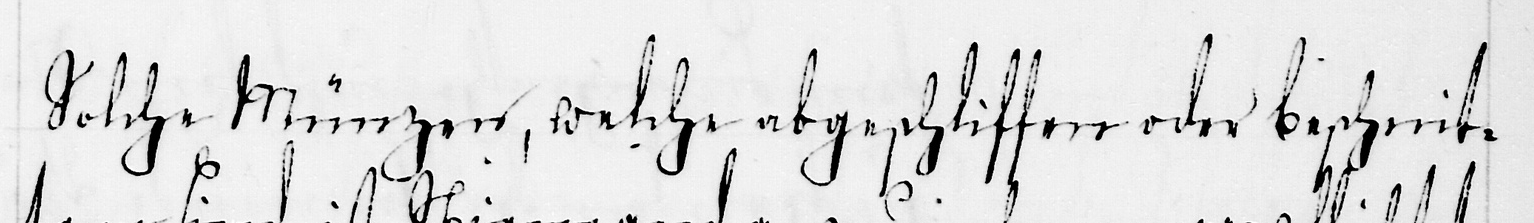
Solche Münzen, welche abgeschliffen oder beschnit¬
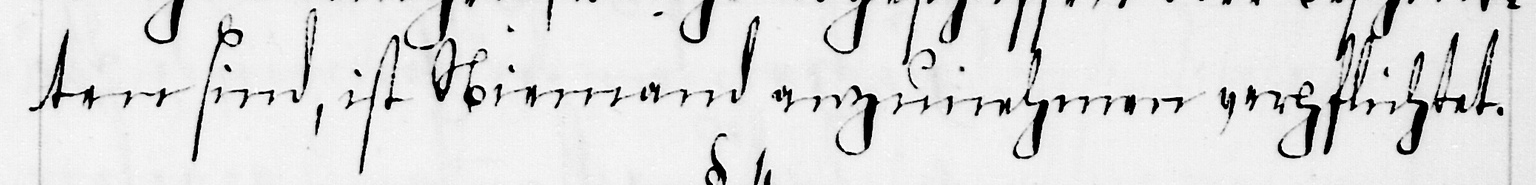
ten sind, ist Niemand anzunehmen verpflichtet.
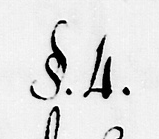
§. 4.
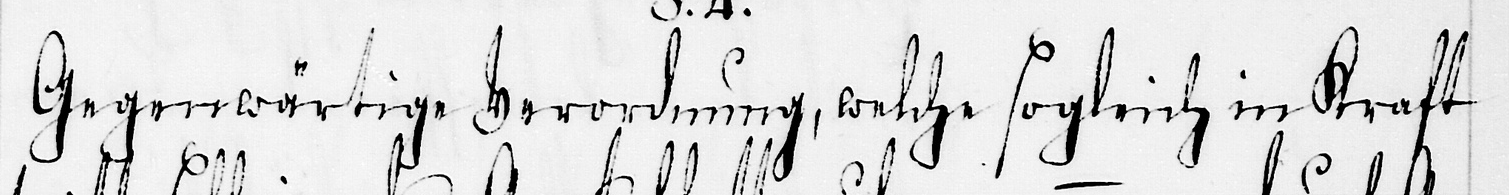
Gegenwärtige Verordnung, welche sogleich in Kraft
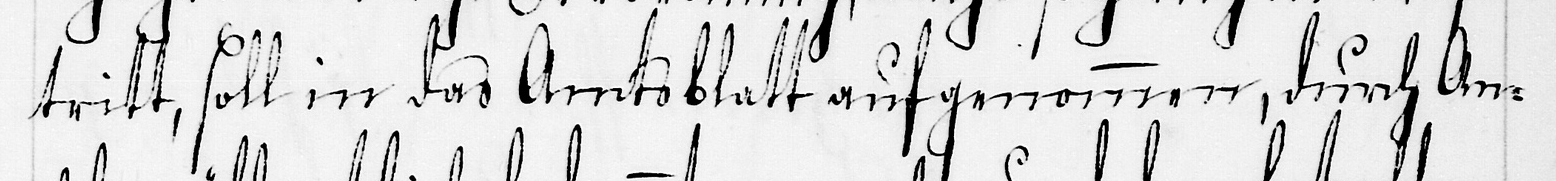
tritt, soll in das Amtsblatt aufgenommen, durch An¬
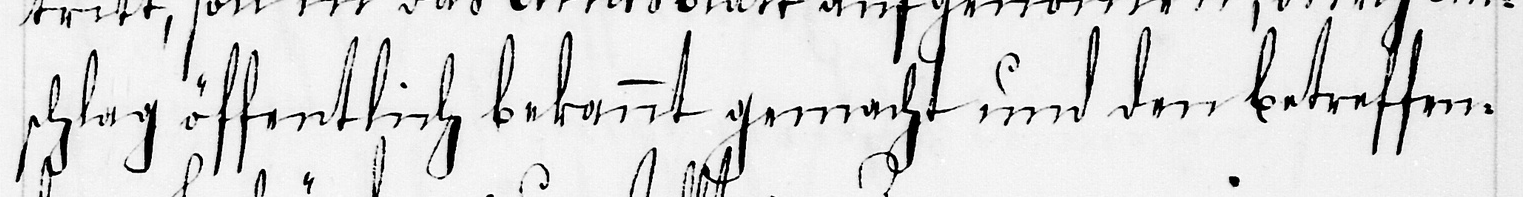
schlag öffentlich bekannt gemacht und den betreffen¬
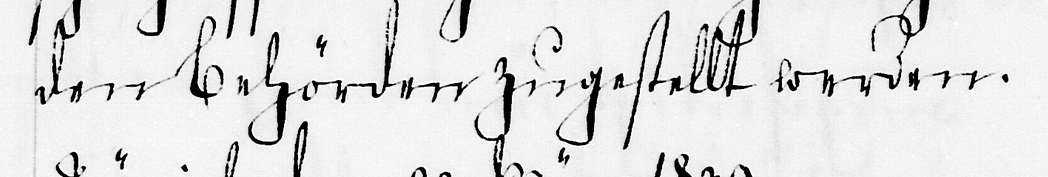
den Behörden zugestellt werden.
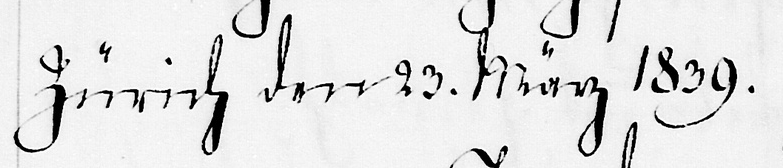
Zürich den 23. März 1839.
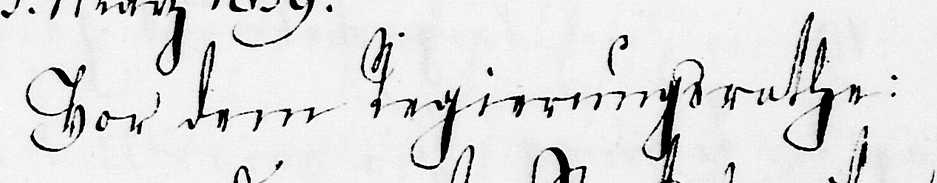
Vor dem Regierungsrathe:
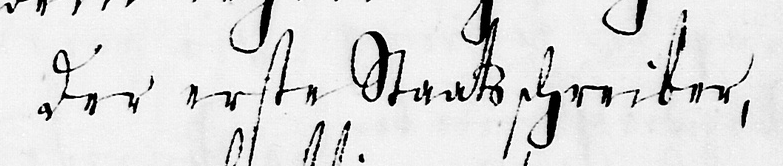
Der erste Staatsschreiber,
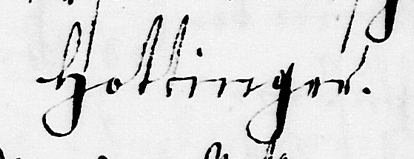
Hottinger.
